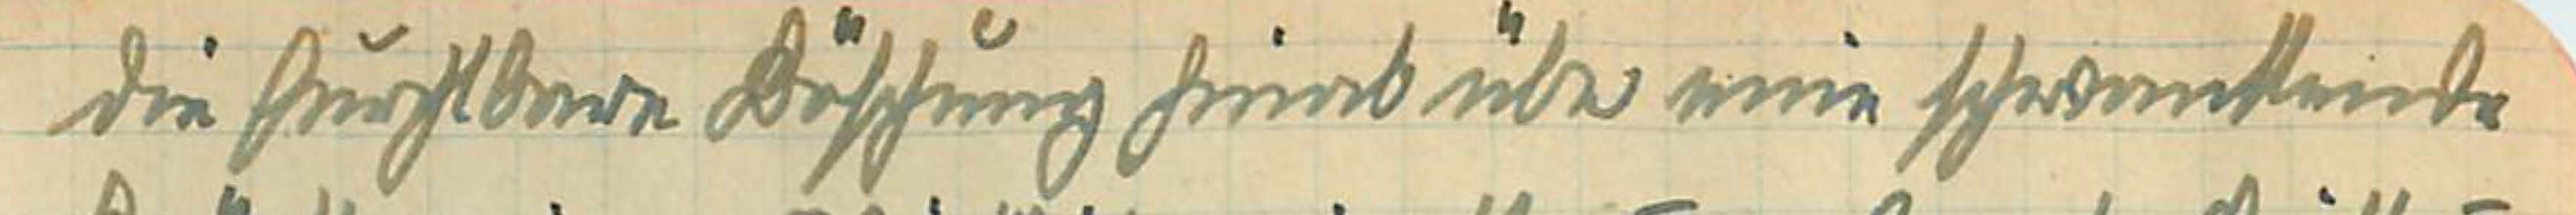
die furchtbare Böschung hinab über eine schwankende
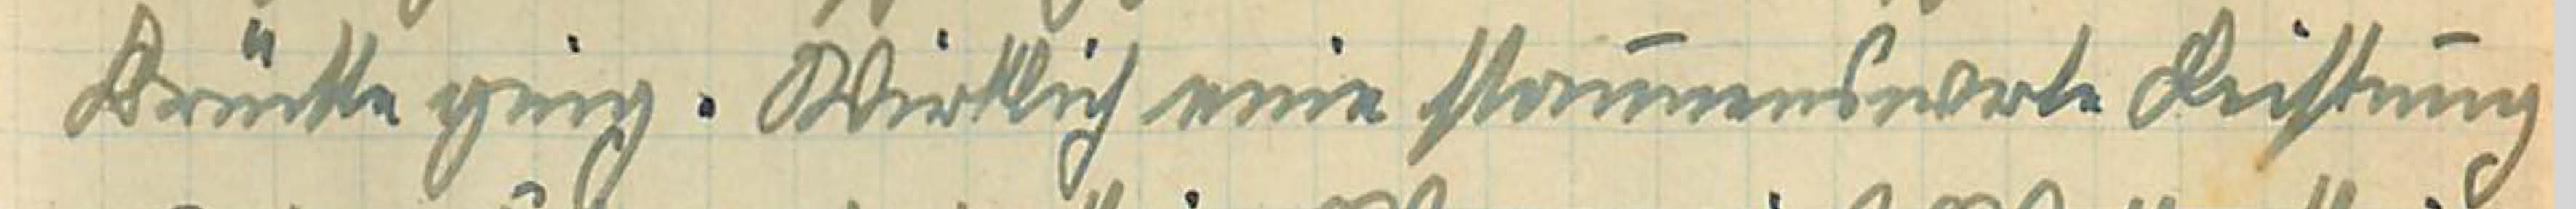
Brücke ging. Wirklich eine staunenswerte Leistung
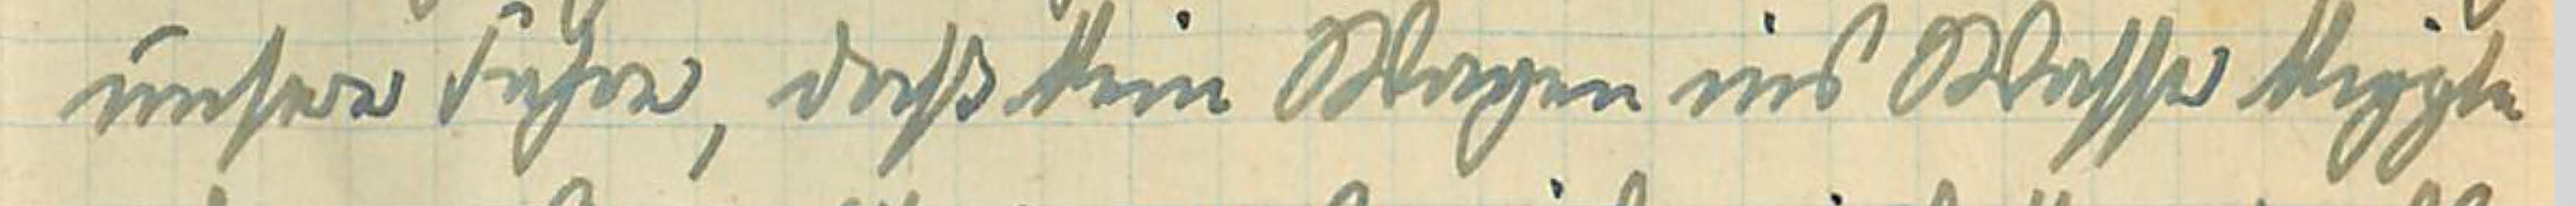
unserer Fahrer, daß kein Wagen ins Wasser kippte
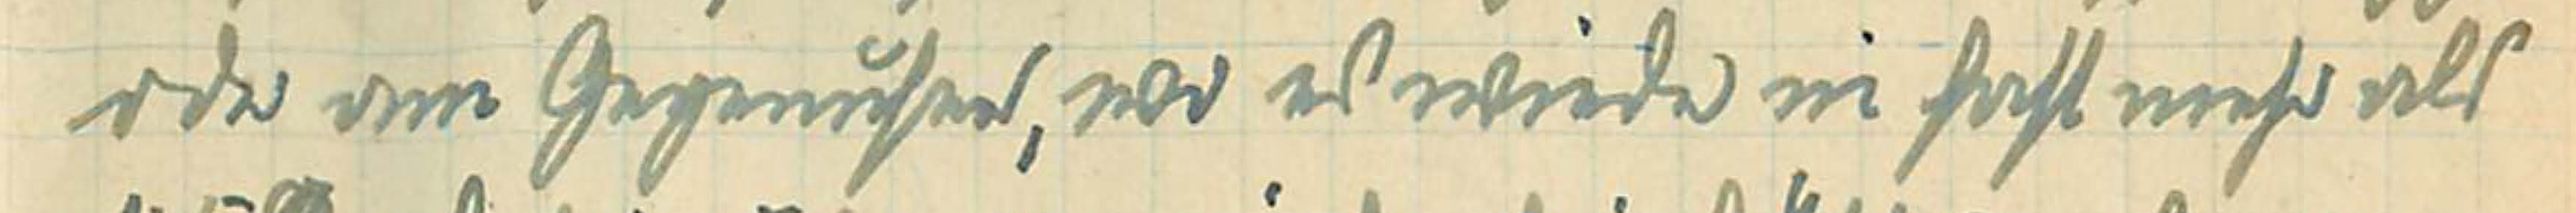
oder am Gegenufer, wo es wieder in fast mehr als
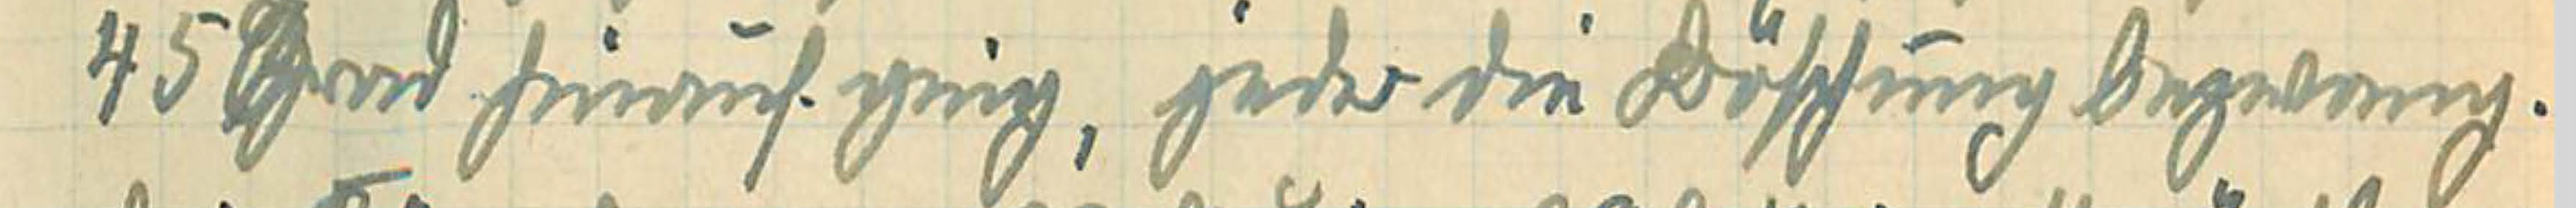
45 Grad hinaufging, jeder die Böschung bezwang.
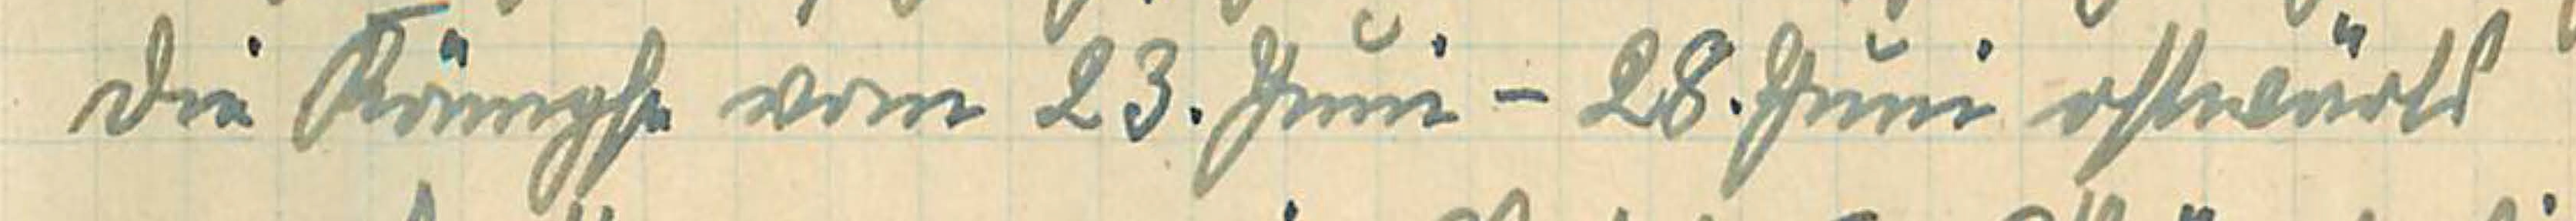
Die Kämpfe vom 23. Juni – 28. Juni ostwärts
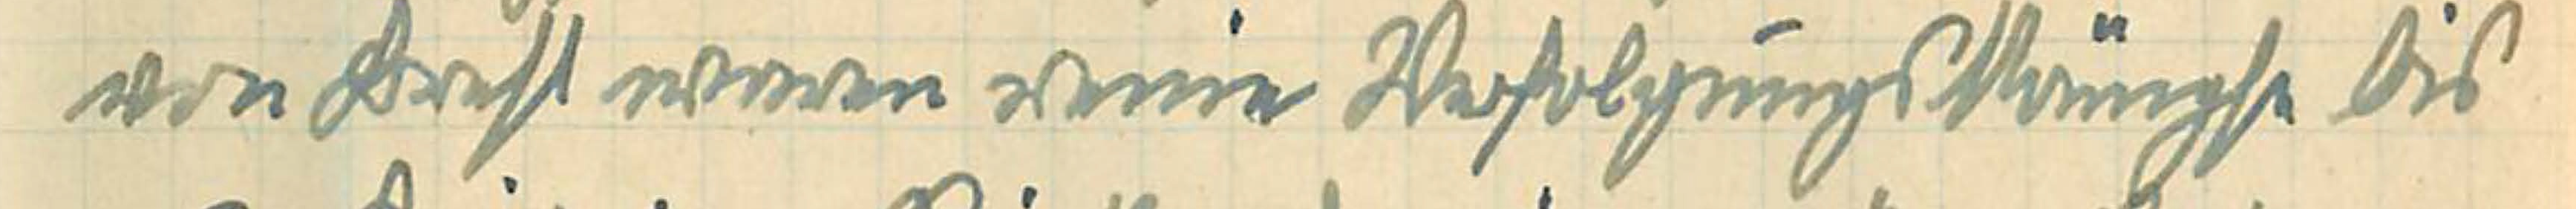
von Brest waren reine Verfolgungskämpfe bis
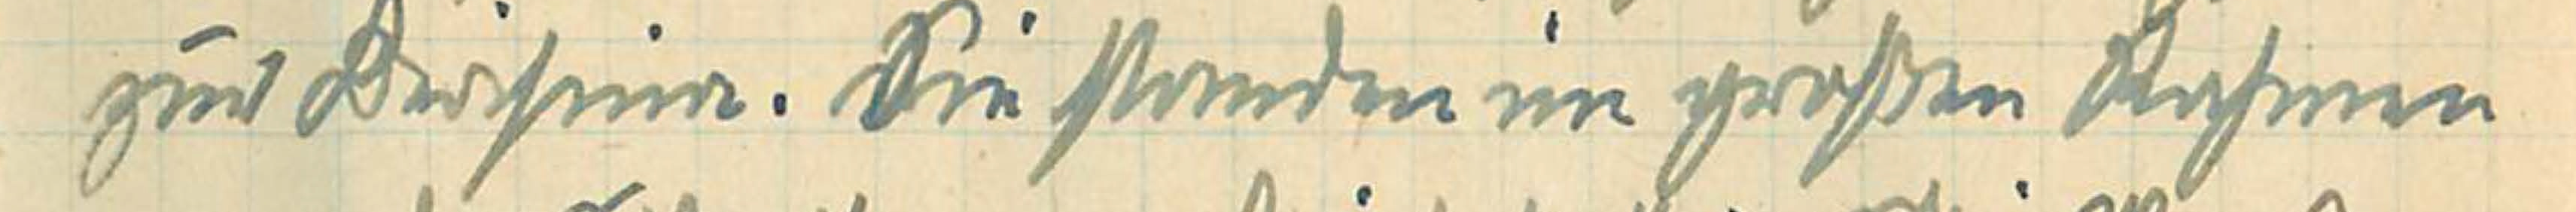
zur Berisina. Sie standen im großen Rahmen
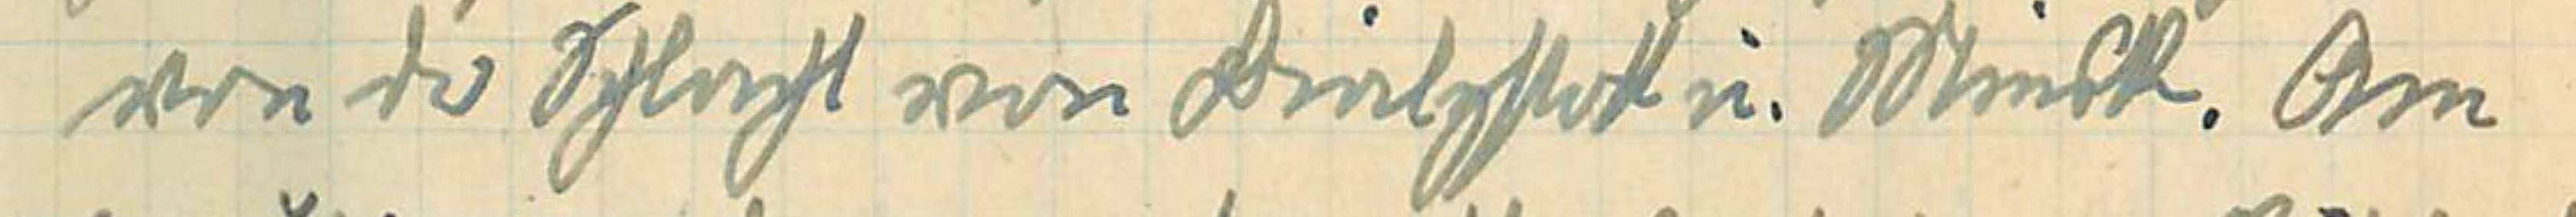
von der Schlacht von Bialystok u. Minsk. Am
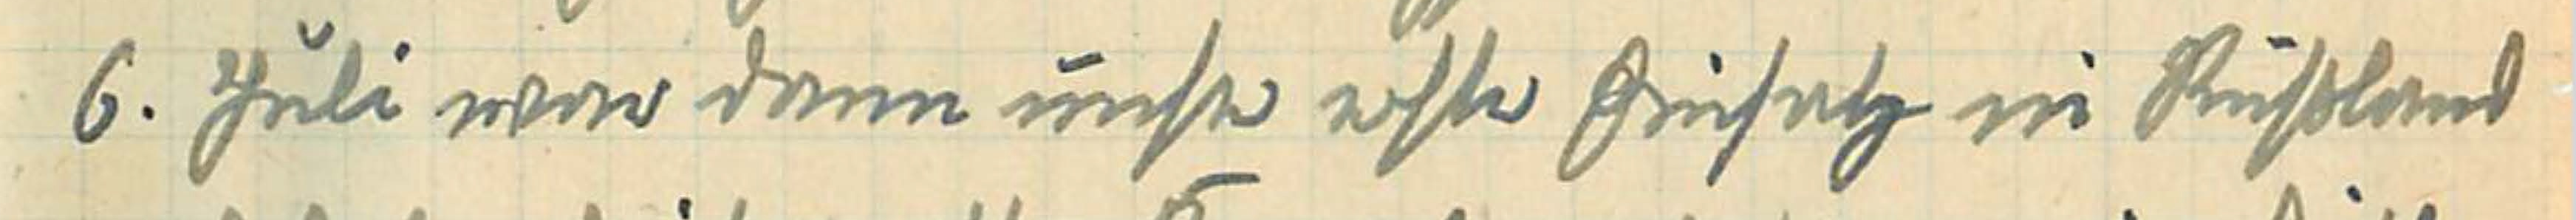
6. Juli war dann unser erster Einsatz in Rußland
